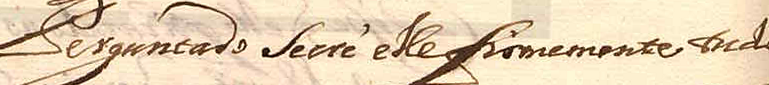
Perguntado se cré elle firmemente tudo
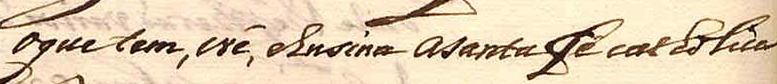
o que tem, cré, e Ensina a santa fé catholica
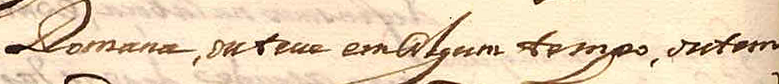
Romana, ou teue em algum tempo, ou tem
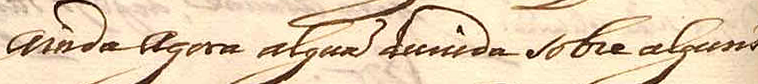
ainda agora alguā duuida sobre alguns
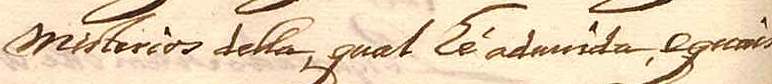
misterios della, qual hé a duuida, e quais
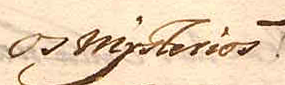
os mysterios?
